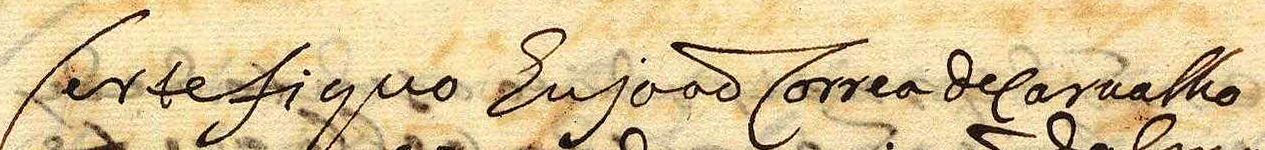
Certefiquo Eu joaõ Correa de carualho
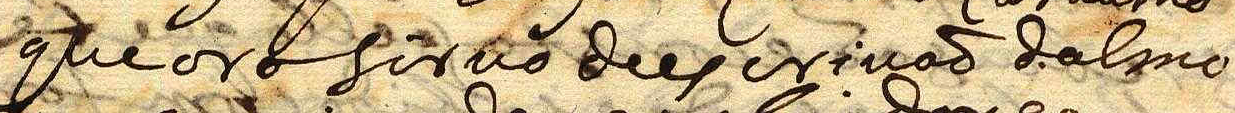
que ora siruo de escriuaõ dalmo
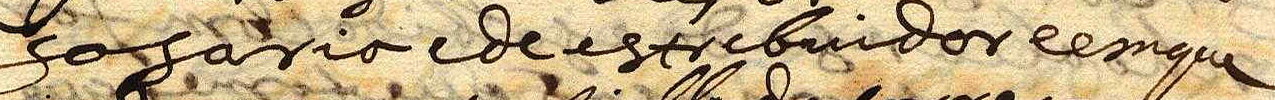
tasaria e de estrebuidor e emque
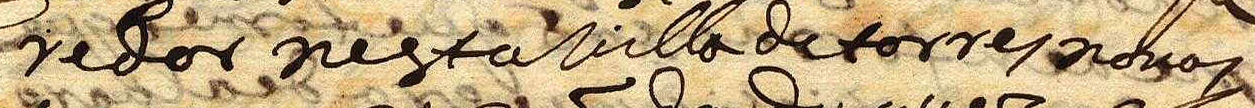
redor nesta villa de torres nouas
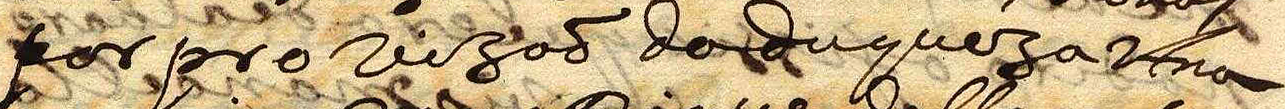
por provizaõ da duqueza Ana
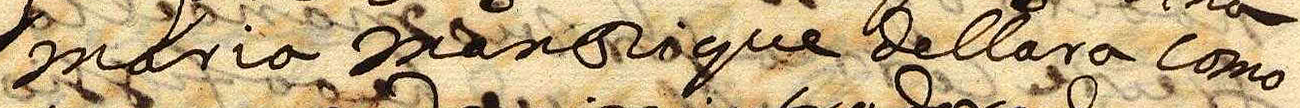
maria manRique de llara como
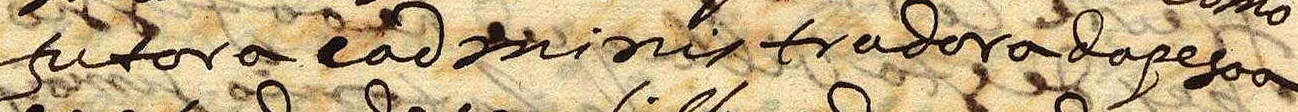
tutora e administradora da pesoa
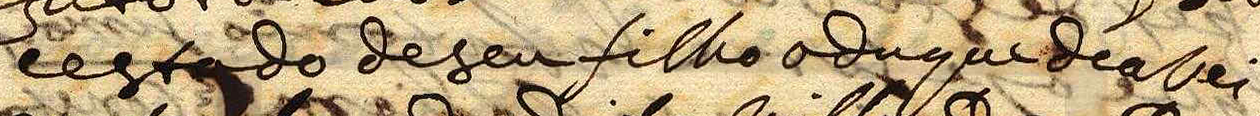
e estado de seu filho o duque de avei
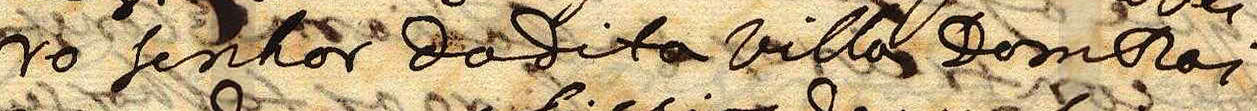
ro senhor da dita villa Dom Rai
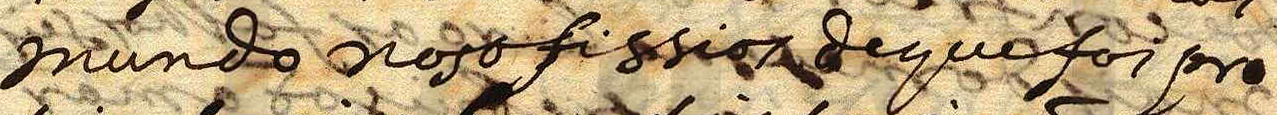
mundo nos ofissios de que foi pro
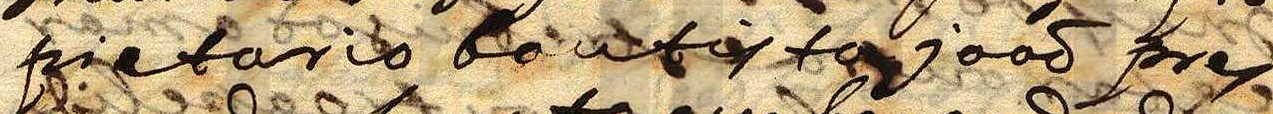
pietario bautista joaõ pres
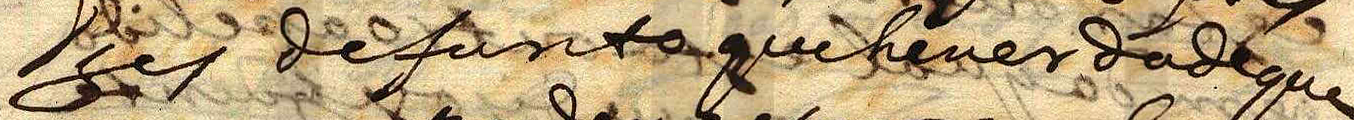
tes defunto que he uerdade que
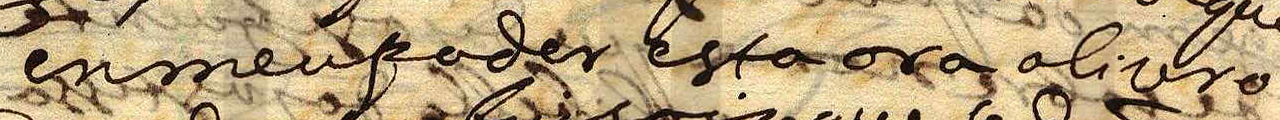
en meu poder esta ora o livro
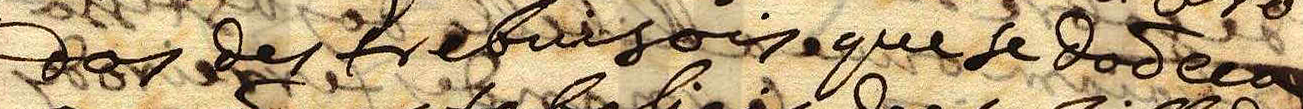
das destrebuisois que se daõ e ca
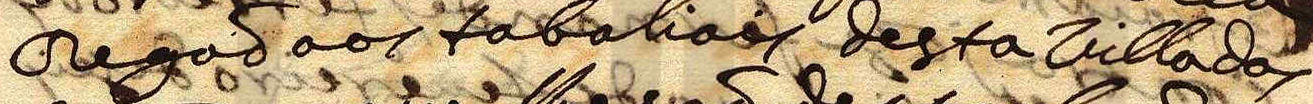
Regaõ aos tabaliais desta villa das
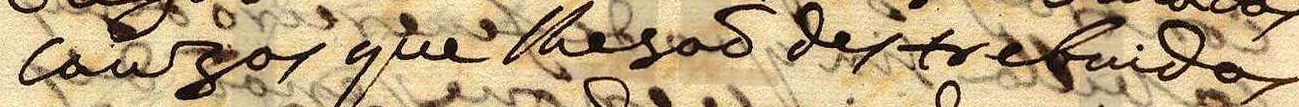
cauzas que lhe saõ destrebuidas
